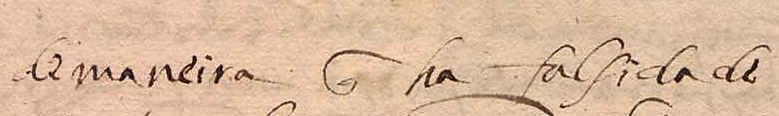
de maneira q̄ ha falsidade
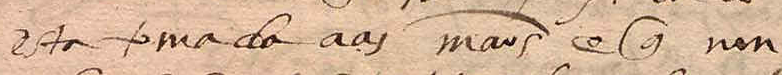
esta tomada aas mãos e q̄ non
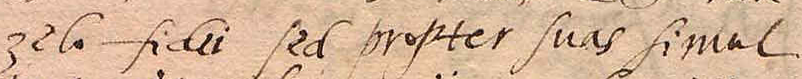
zelo fidei sed propter suas simul
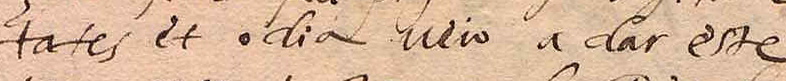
tates et o dia ueio a dar este
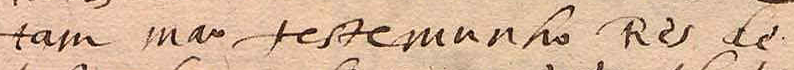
tam mao testemunho Res de
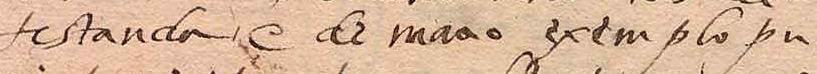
testanda e de maao exemplo pu
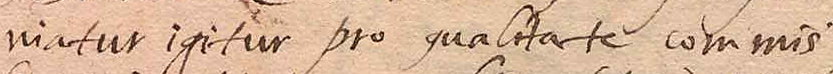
niatur igitur pro qualitate commis
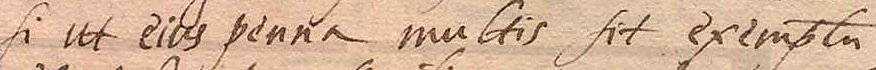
si ut eius penna multis sit exemp̄lu
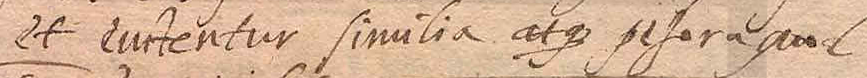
et euitentur similia atqꝫ peJora quod
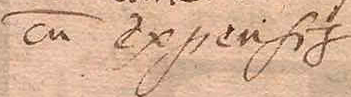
cū expensis
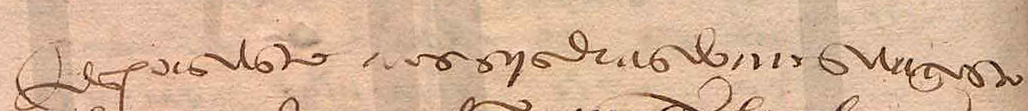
E depois desto aos sejs dias do mes dagosto
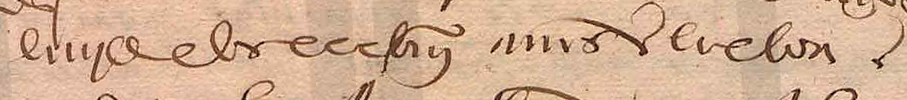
de mjll e bc xxxbiijo anōs ē lixboa ē
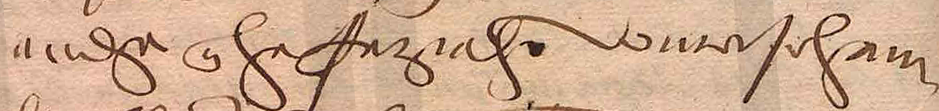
audja q̄ hi fazia ho doutor Joham
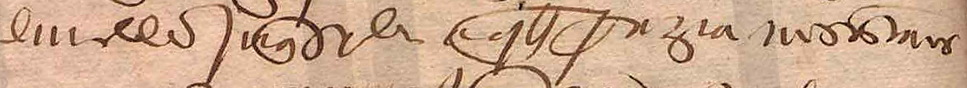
de mello Jnq̄sydor a q̄ll fazia nos estaos
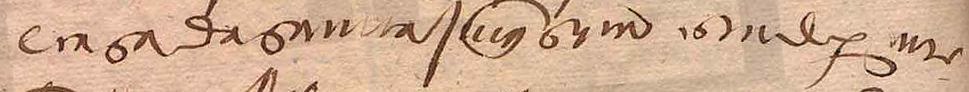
e casa da samta Jmq̄syçā estando ꝑsente
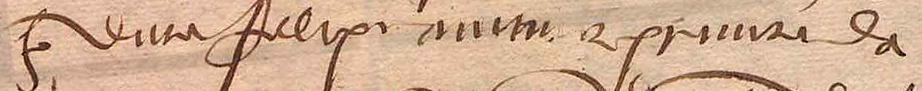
ho doutor fellipe antunez promotor da
